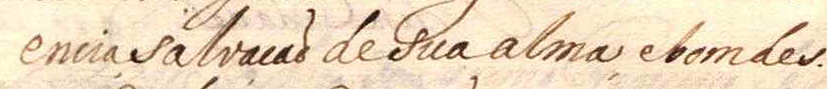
encia salvaçaõ de sua alma, e bom des
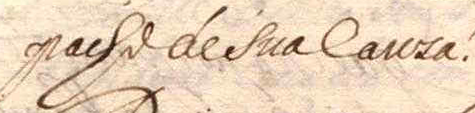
pacho de sua cauza?
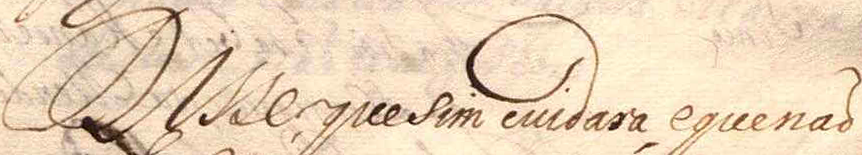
Disse que sim cuidara, e que naõ
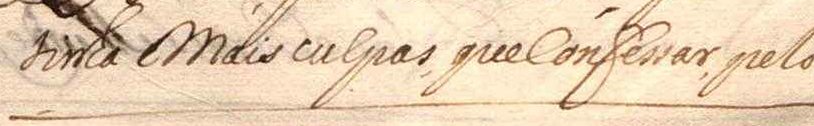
tinha mais culpas que Confessar, pelo
